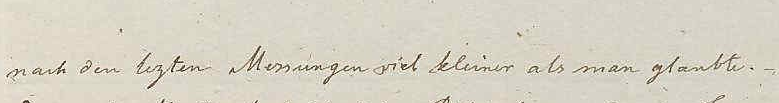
nach den lezten Messungen sviel kleiner als man glaubte. –
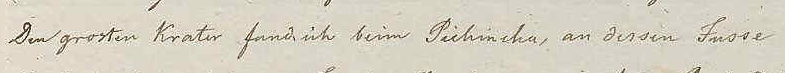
Den grosten Krater fand ich beim Pichincha, an dessen Fusse
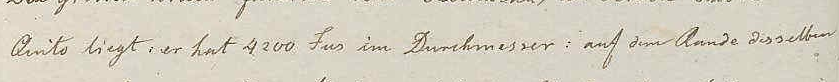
Quito liegt: er hat 4200 Fus im Durchmesser: auf dem Rande desselben
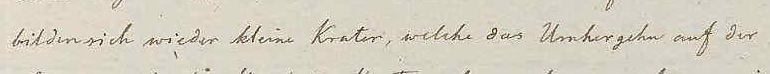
bilden sich wieder kleine Krater, welche das Umhergehn auf der
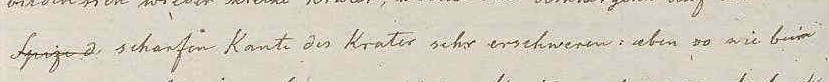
Spize d scharfen Kante des Krater sehr erschweren: eben so wie beim
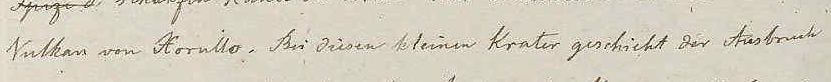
Vulkan von Xorullo. Bei diesen kleinen geschickt der Ausbruch
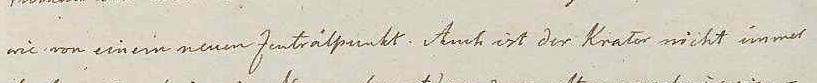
wie von einem neuen Zentralpunkt. Auch ist der Krater nicht immer
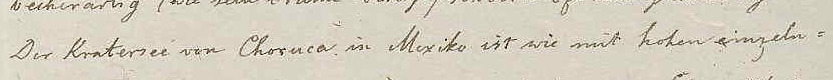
Der Kratersee von Choruca in Mexiko ist wie mit hohen einzeln-
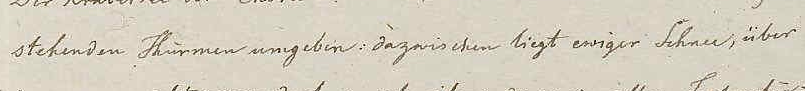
stehenden Thürmen umgeben: dazwischen liegt ewiger Schnee, über
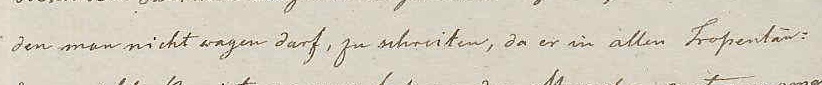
den man nicht wagen darf, zu schreiten, da er in allen Tropenlän-
